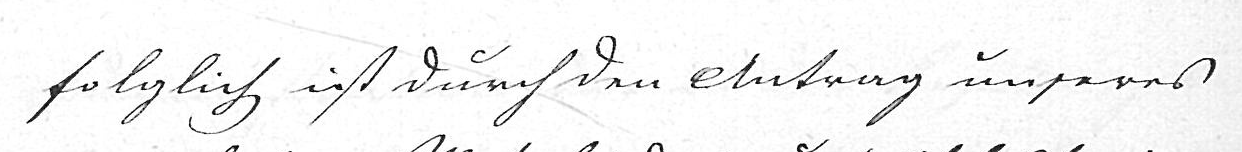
folglich ist durch den Antrag unseres
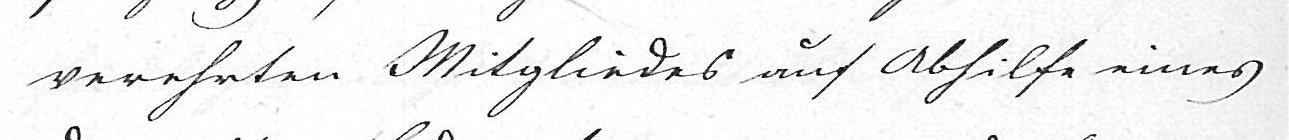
verehrten Mitgliedes auf Abhilfe eines
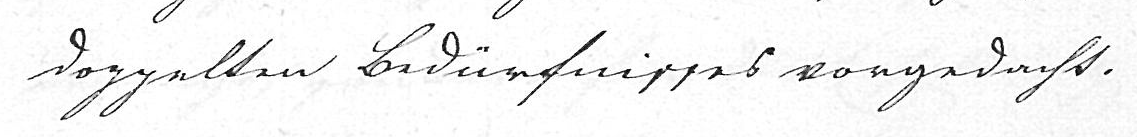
doppelten Bedürfnisses vorgedacht.
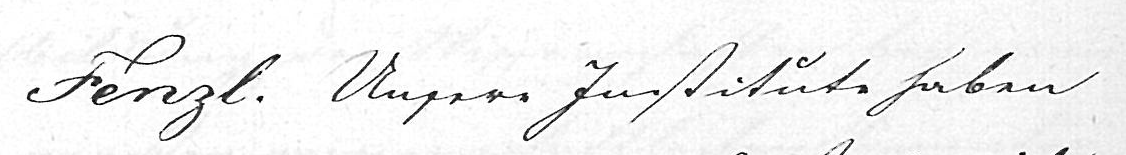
Fenzl. Unsere Institute haben
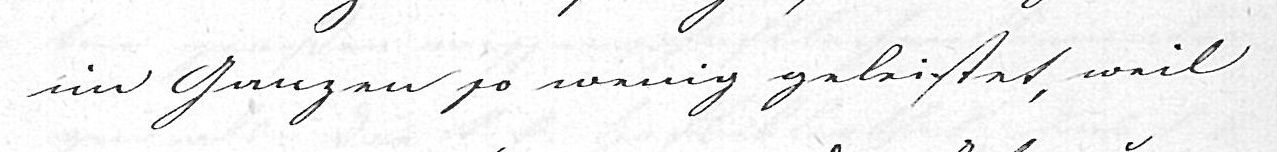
im Ganzen so wenig geleistet, weil
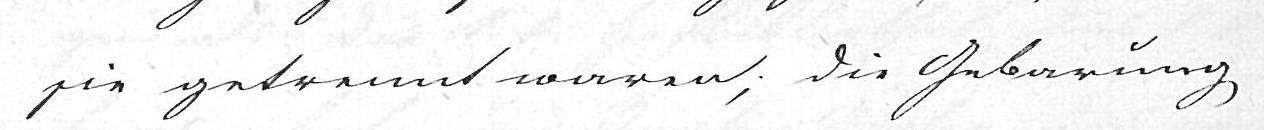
sie getrennt waren. Die Gebarung
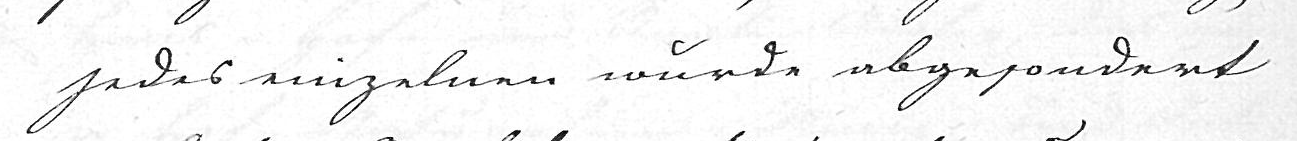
jedes einzelnen wurde abgesondert
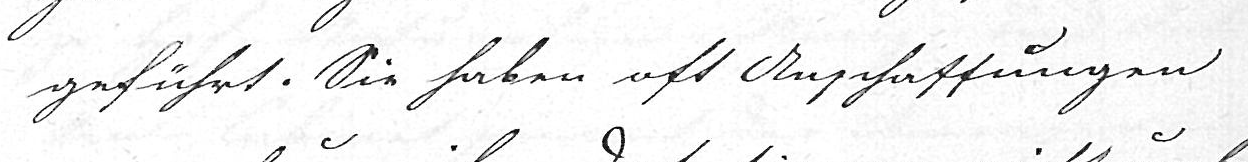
geführt. Sie haben oft Anschaffungen
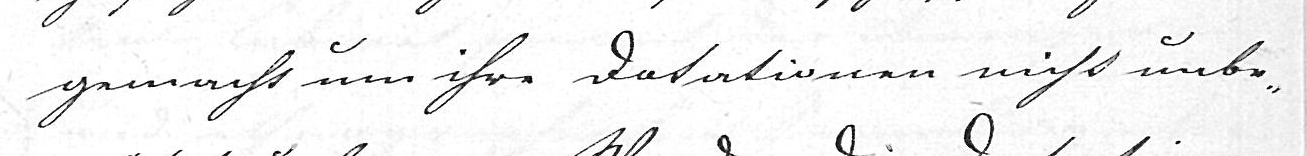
gemacht um ihre Dotationen nicht unbe-
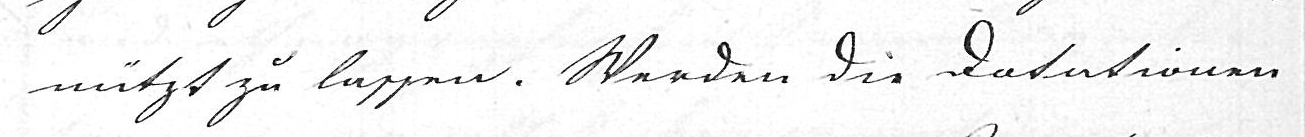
nützt zu lassen. Werden die Dotationen
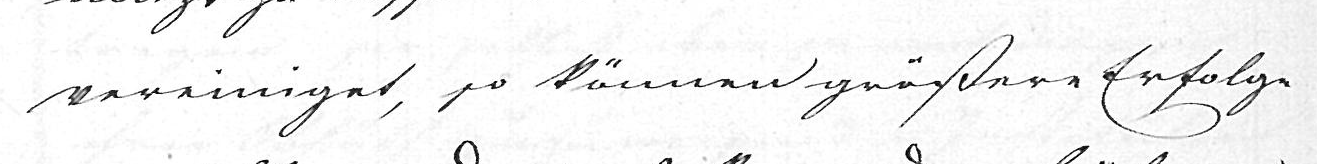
vereiniget, so können größere Erfolge
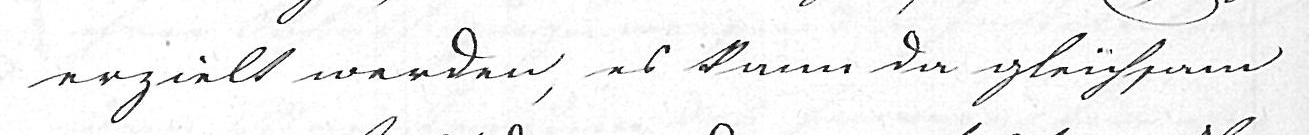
erzielt werden, es kann da gleichsam
